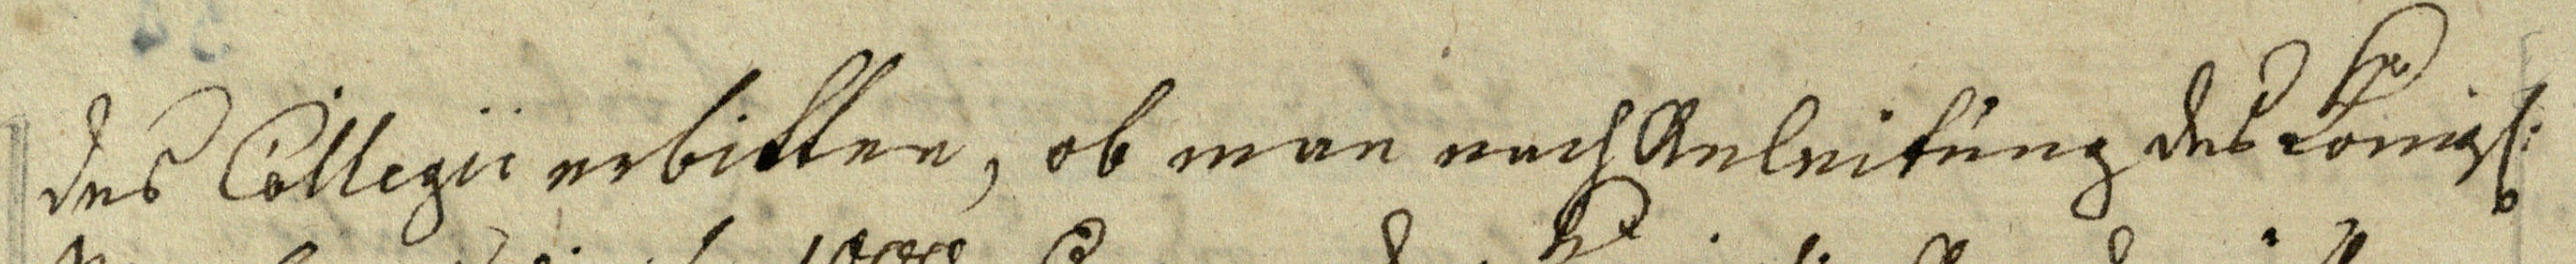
das Collegii erbitten, ob man nach Anleitung des Königl.
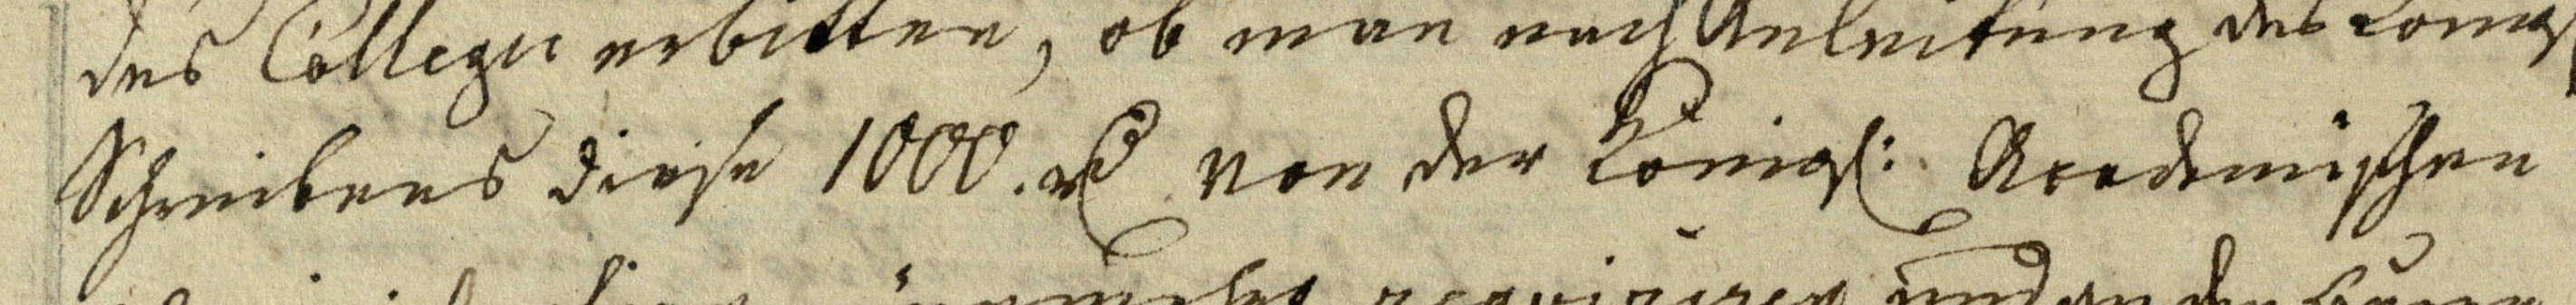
Schreibens diese 1000.r. von der Königl. Academischen
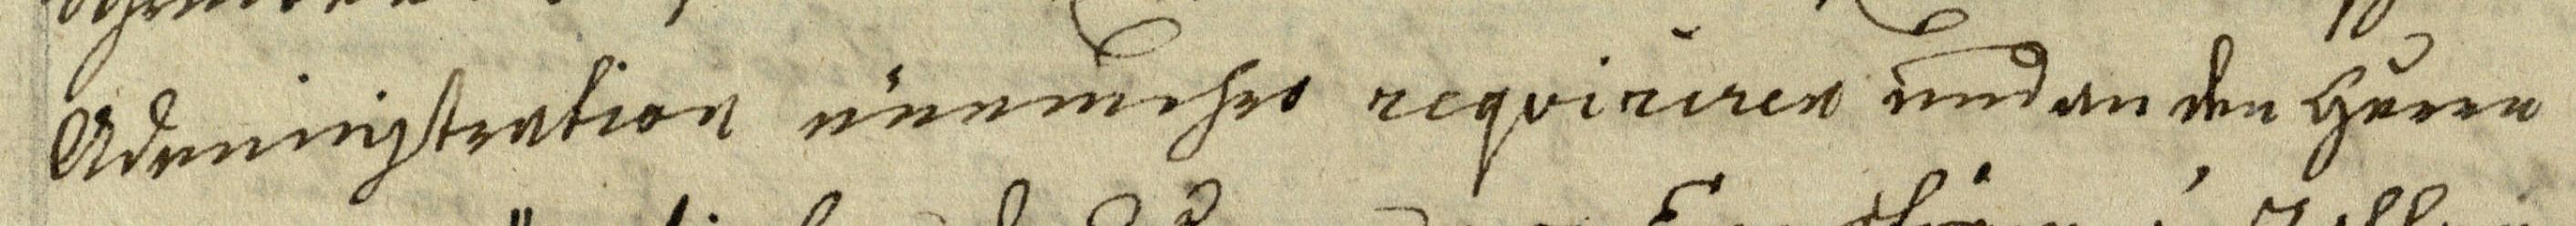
Administration nunmehro requiriren und an den Herrn
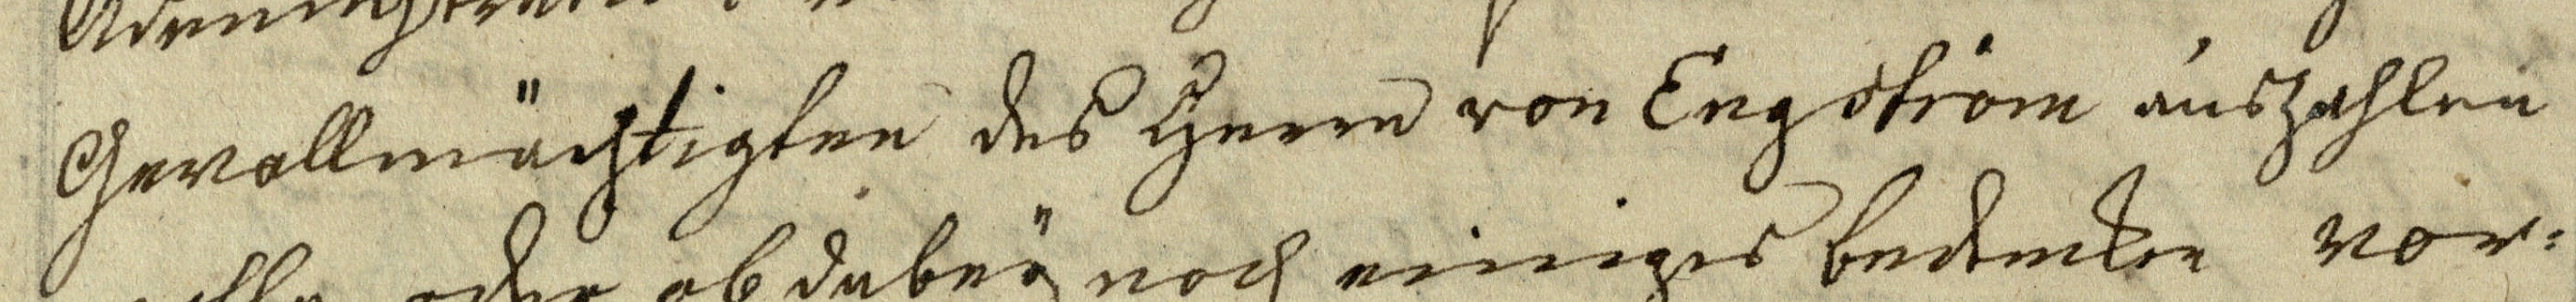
Gevollmächtigten des Herrn von Engström auszahlen
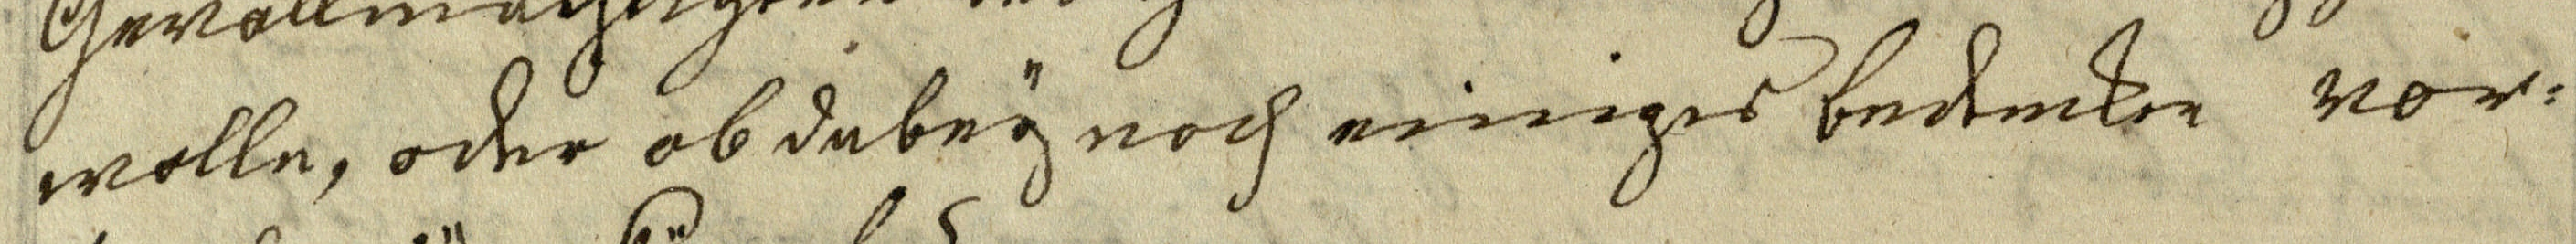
wolle, oder ob dabeÿ noch einiges Bedencken vor¬
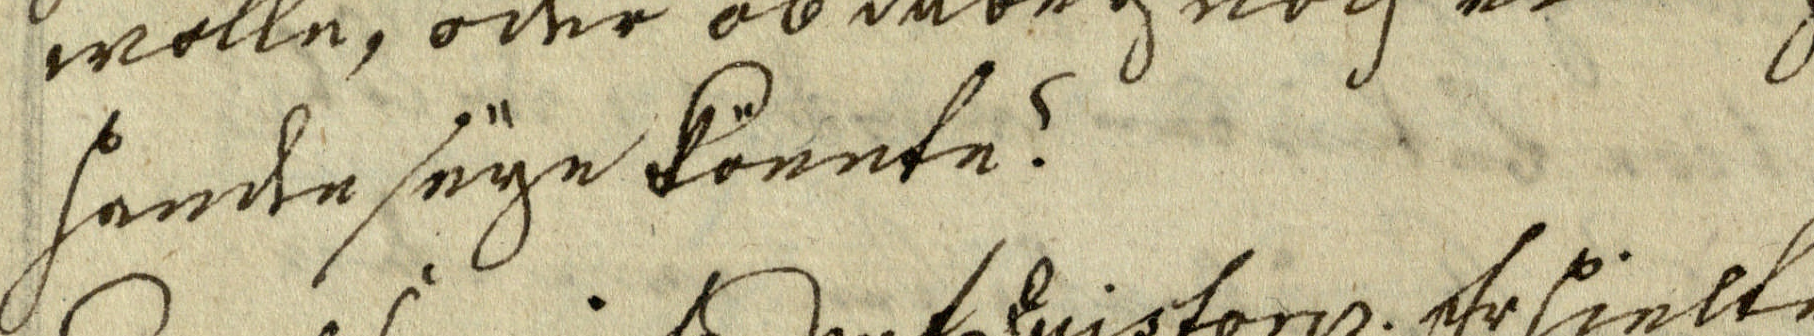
handen seÿn könnte?
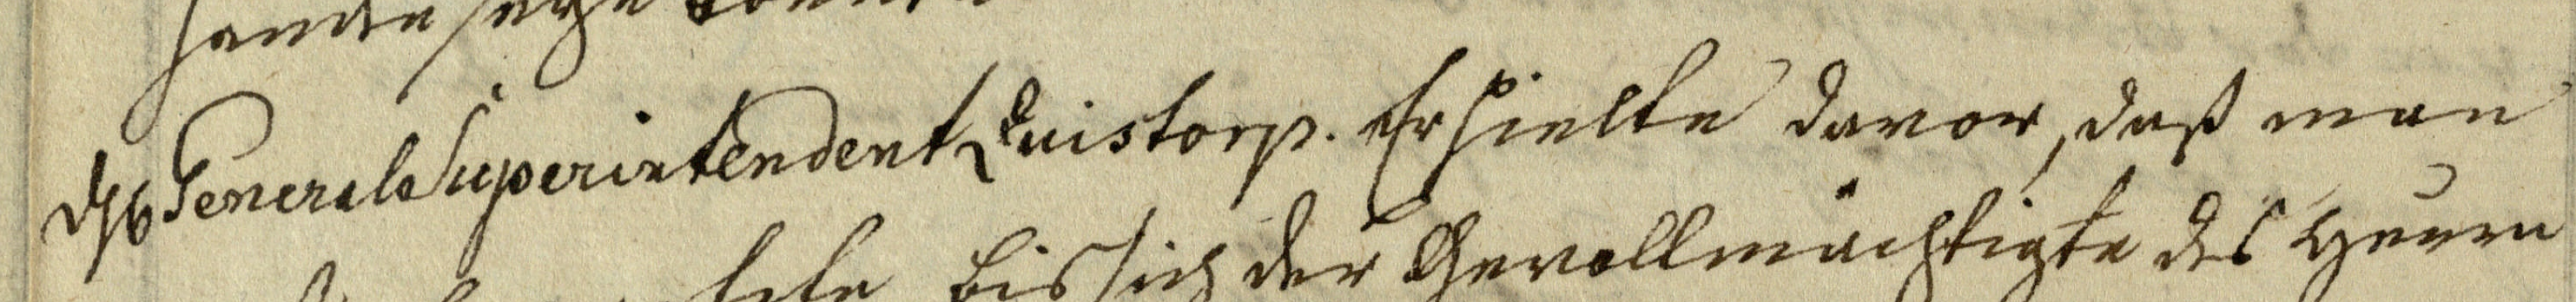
dh. GeneralSuperintendent Quistorp. Er hielte davor, daß man
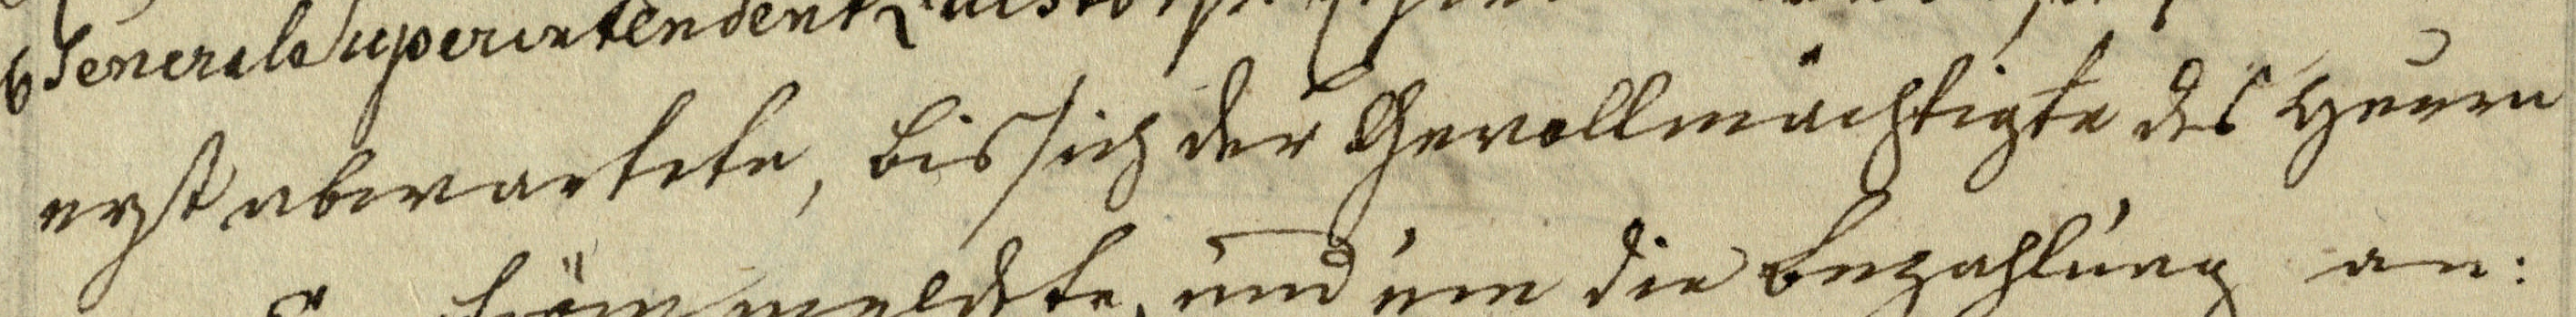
erst abwartete, bis sich der Gevollmächtigte des Herrn
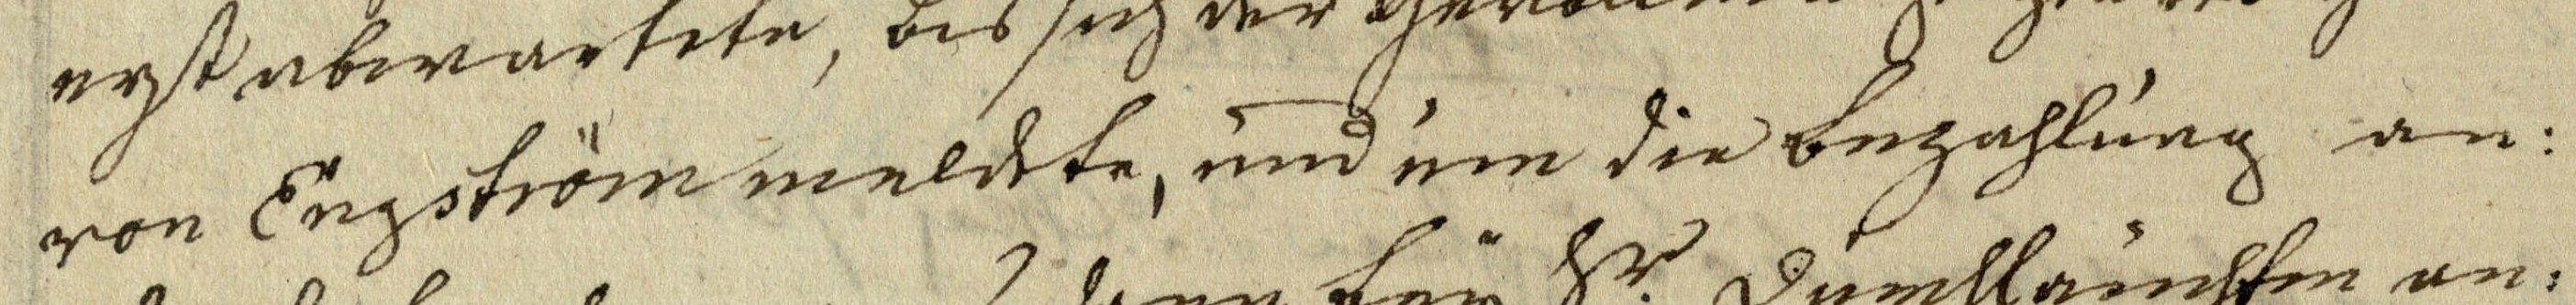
von Engström meldete, und um die Bezahlung an¬
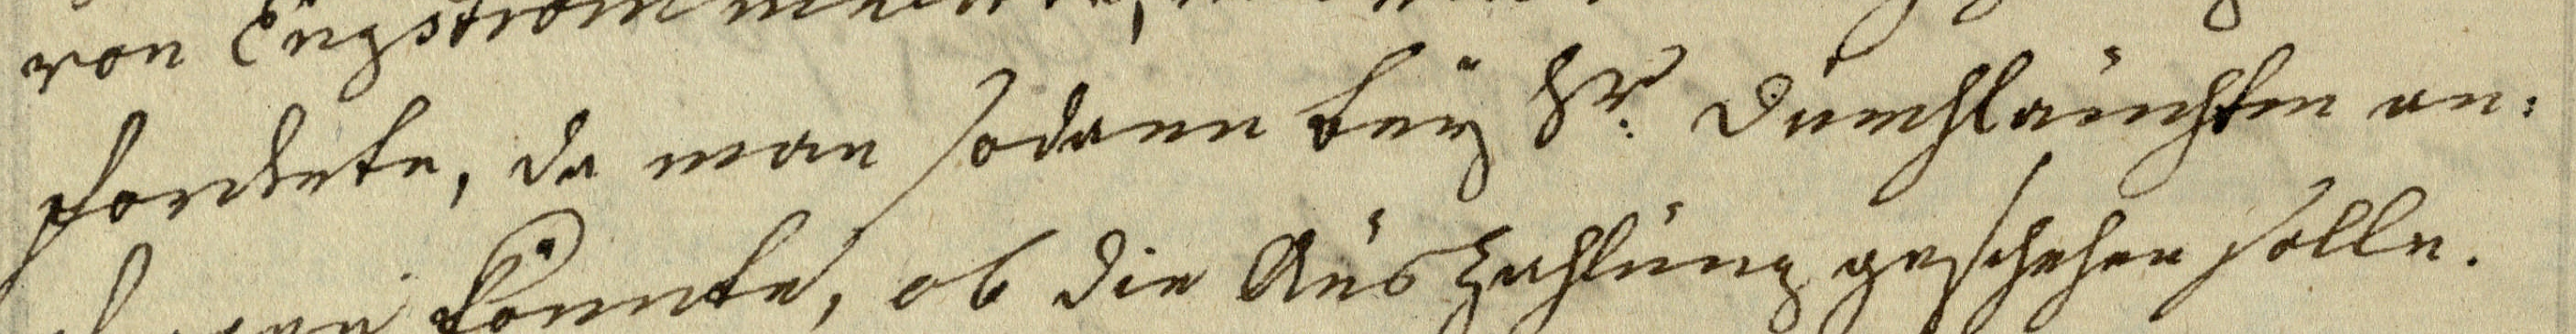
forderte, da man sodann beÿ Sr Durchlauchten an¬
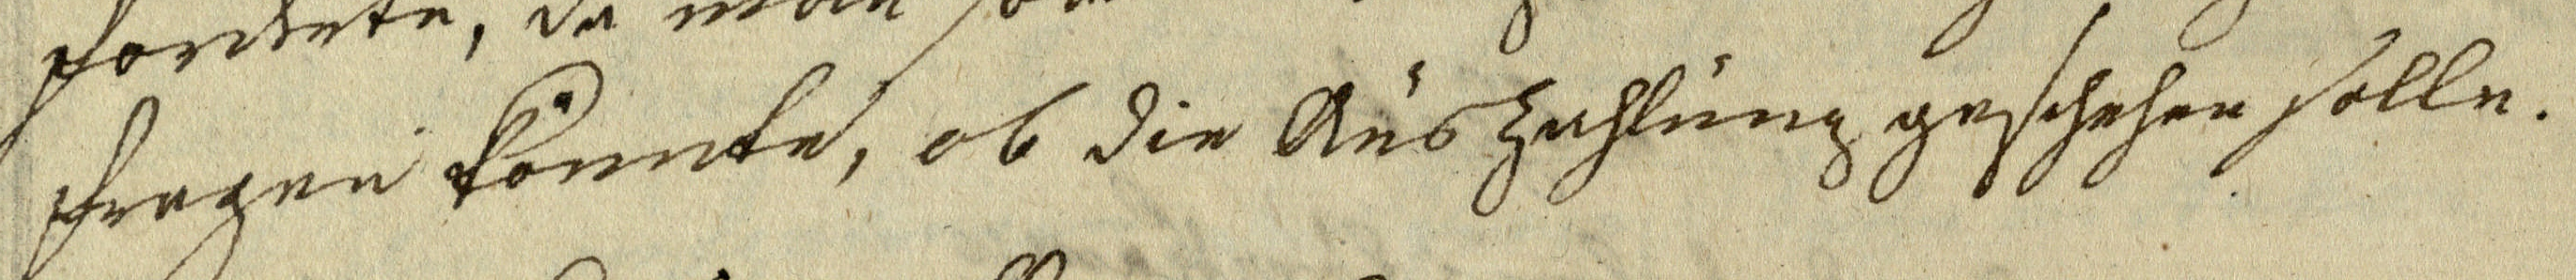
fragen könnte, ob die Auszahlung geschehen solle.
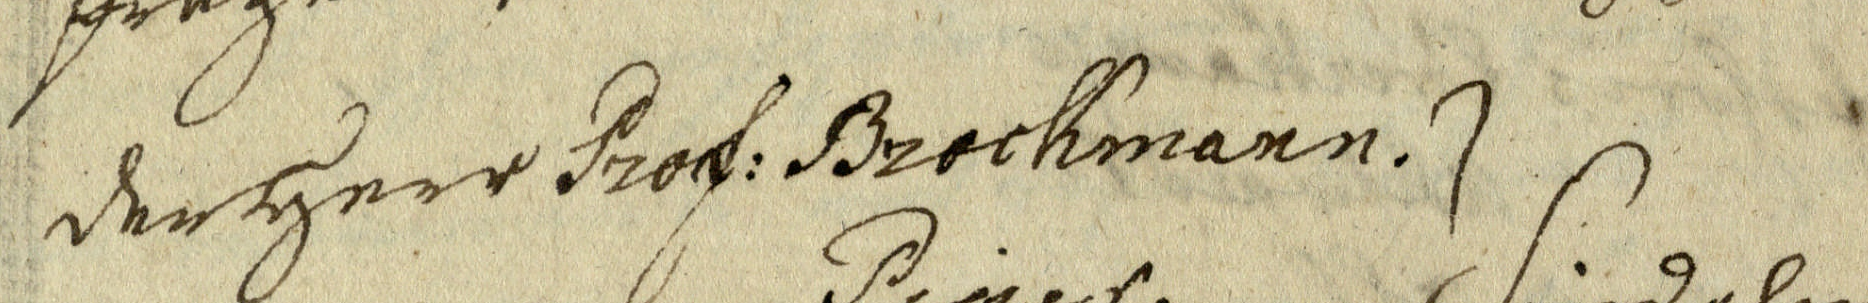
der Herr Prof. Brockmann.
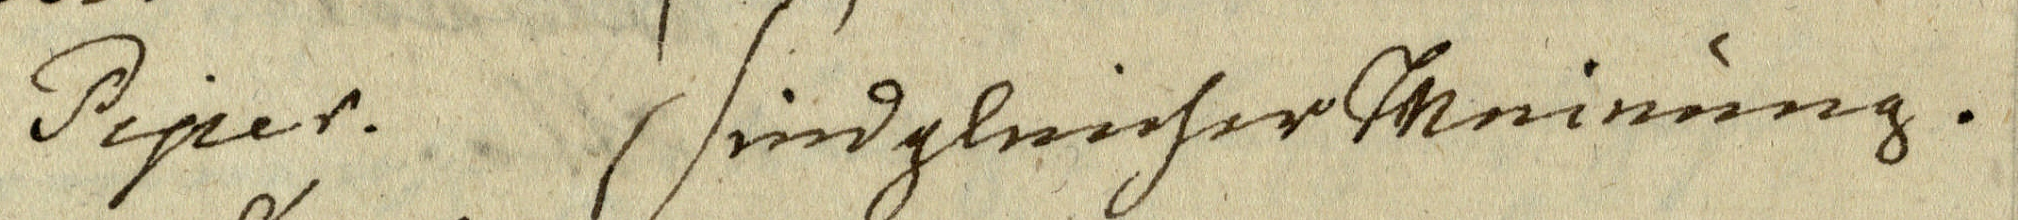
Piper sind gleicher Meinung.
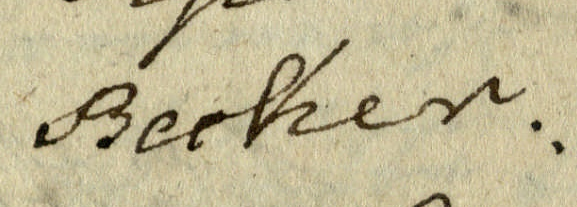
Becker.
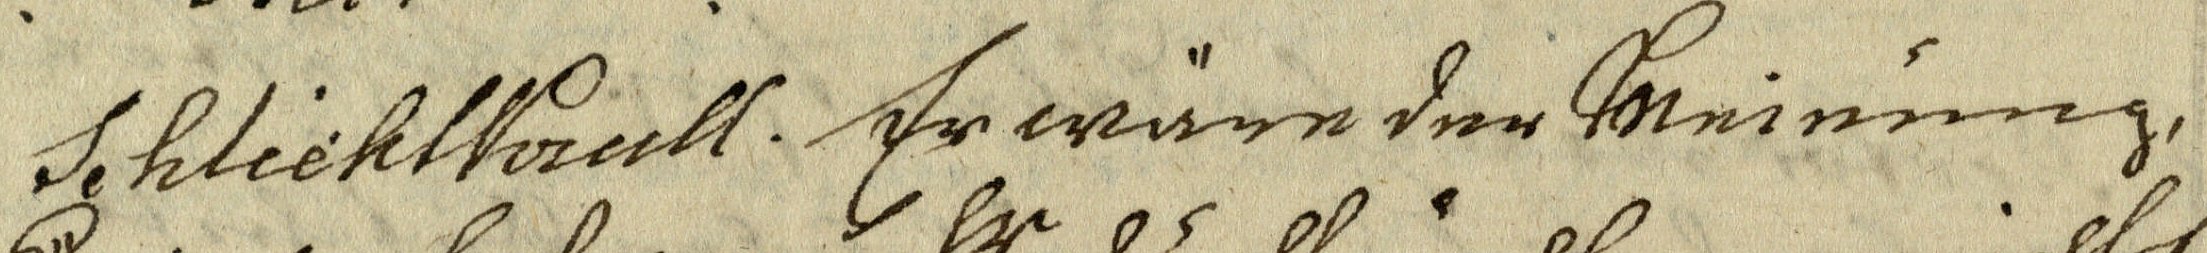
Schlichtkrull. Er wäre der Meinung,
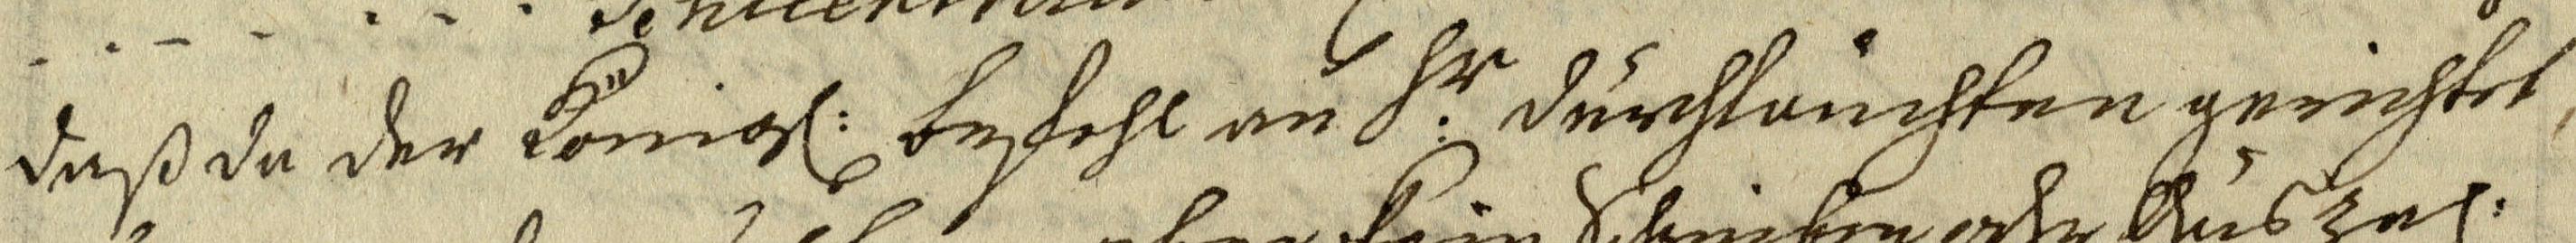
daß da der Königl. Befehl an Sr Durchlauchten gerichtet,
